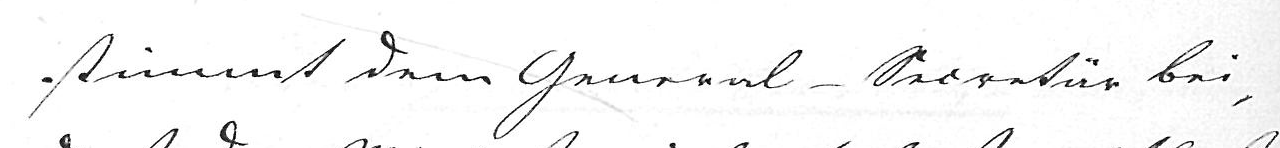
stimmt dem General-Secretär bei,
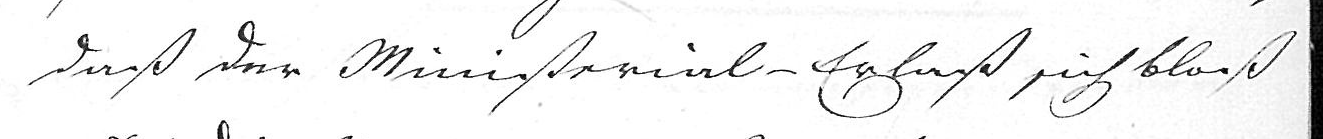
daß der Ministerial-Erlaß sich bloß
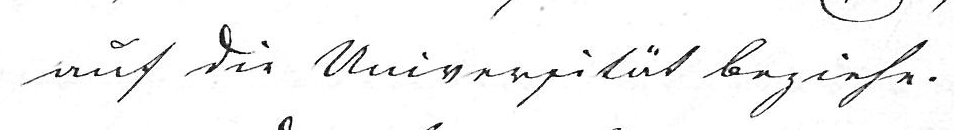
auf die Universität beziehe.
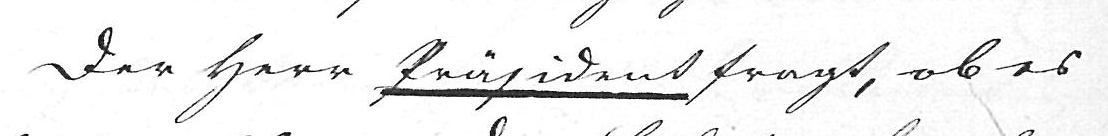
Der Herr Präsident fragt, ob es
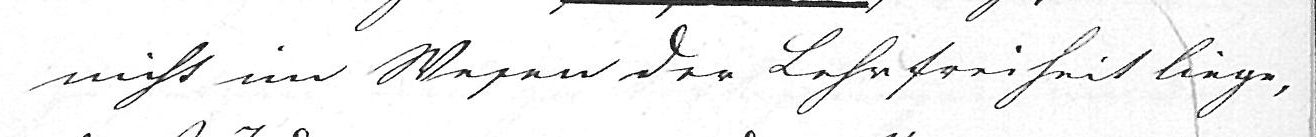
nicht im Wesen der Lehrfreiheit liege,
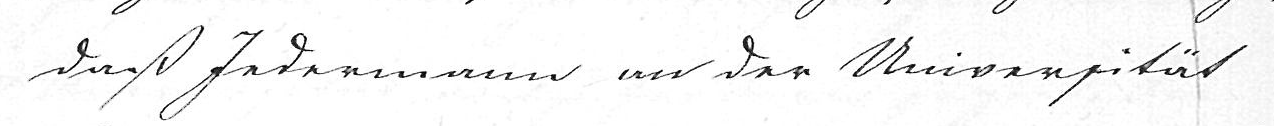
daß Jedermann an der Universität
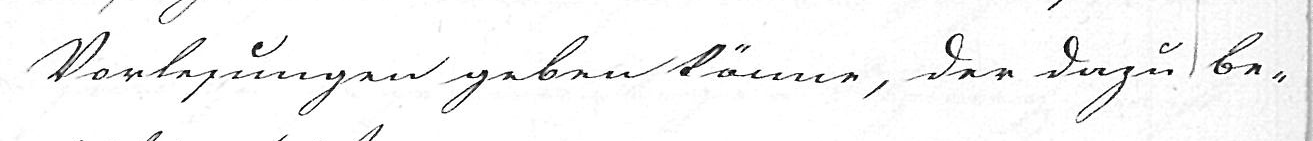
Vorlesungen geben könne, der dazu be-
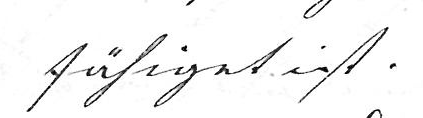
fähiget ist.
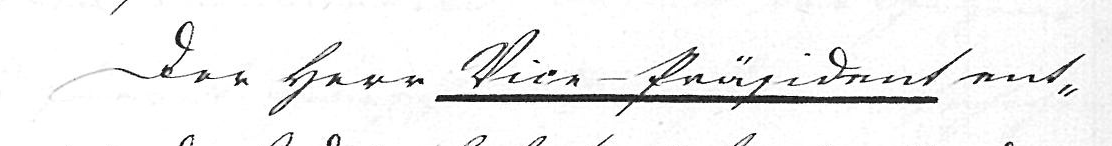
Der Herr Vice-Präsident ent-
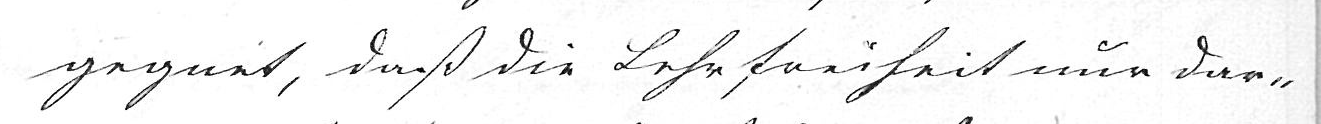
gegnet, daß die Lehrfreiheit nur dar-
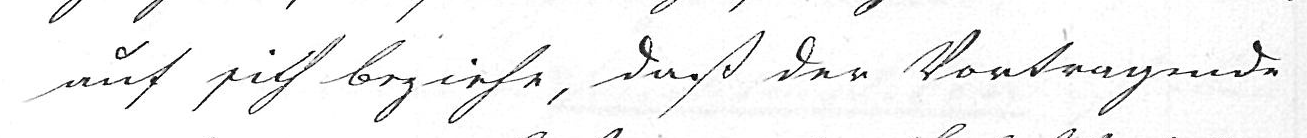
auf sich beziehe, daß der Vortragende
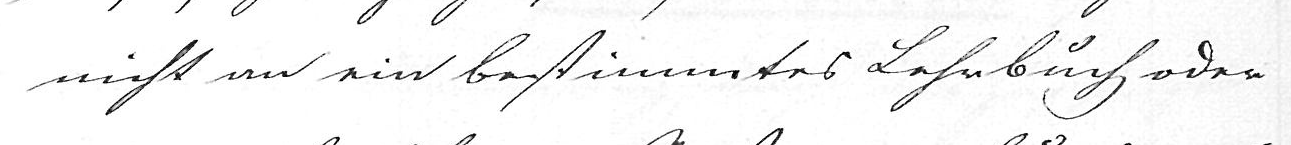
nicht an ein bestimmtes Lehrbuch oder
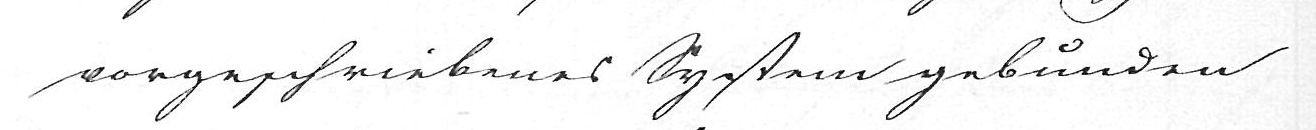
vorgeschriebenes System gebunden
